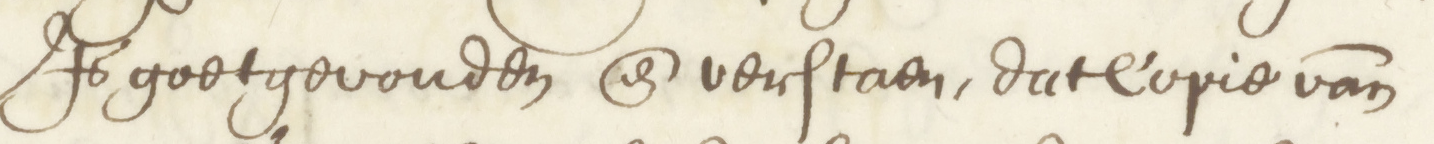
Is goetgevonden & verstaen, dat copie van
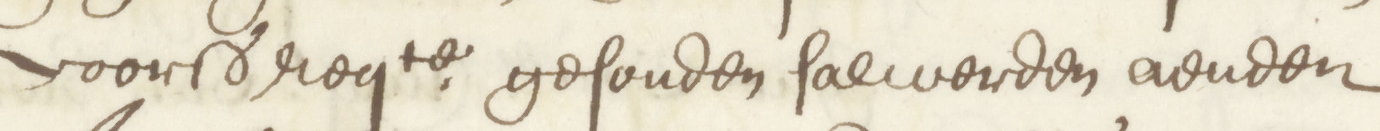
voorsz reqte. gesonden sal worden aenden
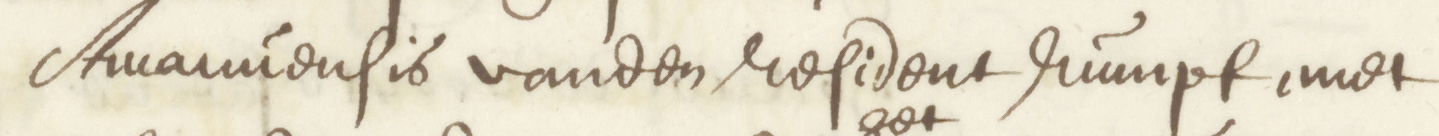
Amanuensis vanden resident Rumpf, met
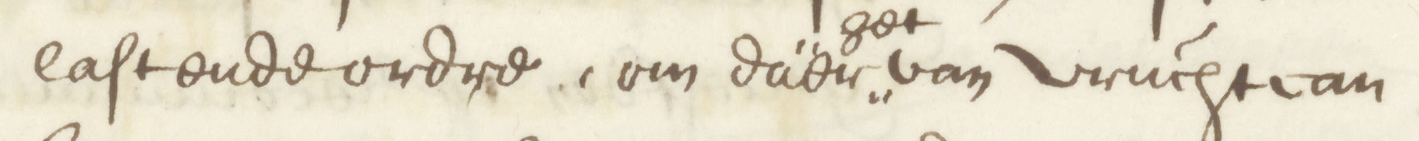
lastende ordre, om daer ,,het ,, van vrucht can
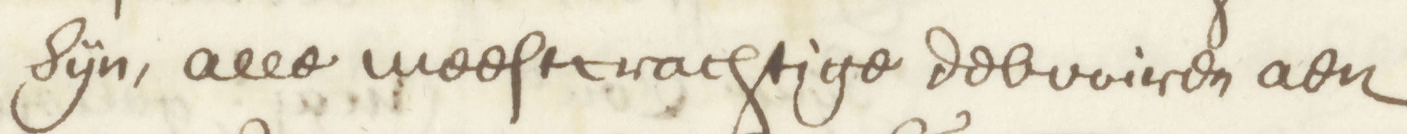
sijn, alle meest crachtige debvoiren aen
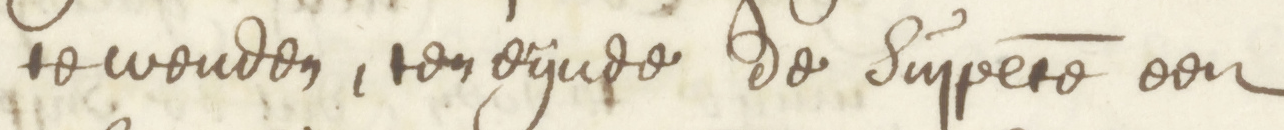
te wenden, ten eijnde de Supplte een
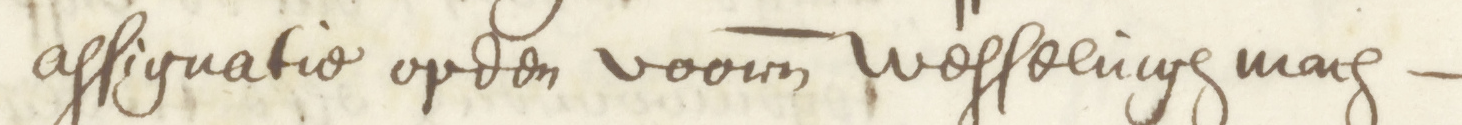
assignatie opden voorn Wesselingh mach—
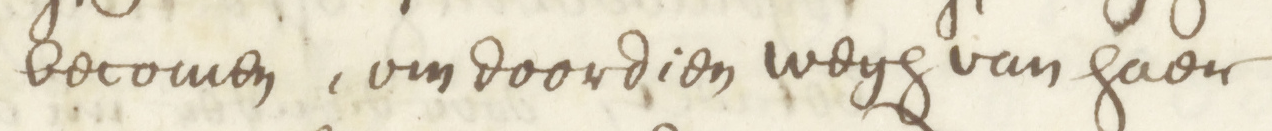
becomen, om doordien wegh van haer
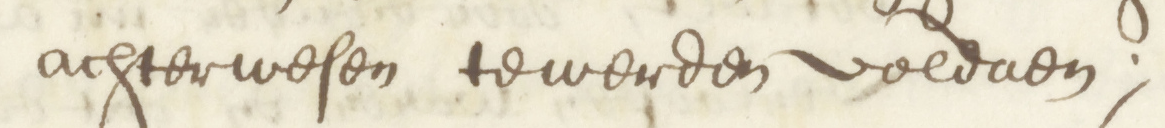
achterwesen te werden voldaen;
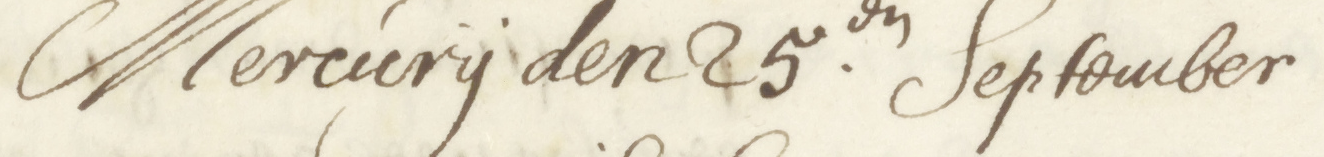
Mercurij de 25en. September.
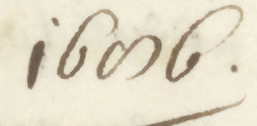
1686.
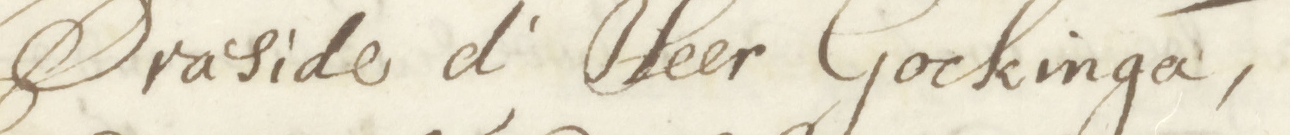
Præside d' Heer Gockinga,
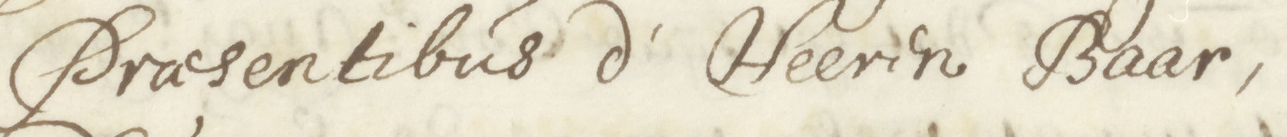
Præsentibus d'Heeren Baar,
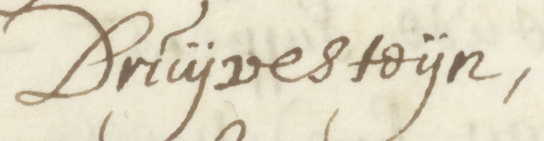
Druijvesteijn,
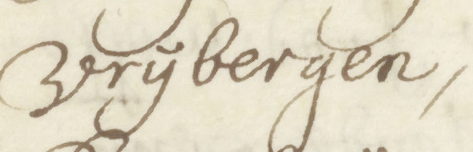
Vrijbergen,
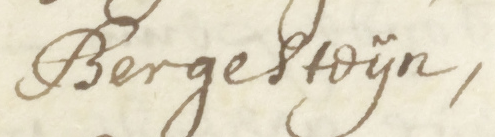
Bergesteijn.
